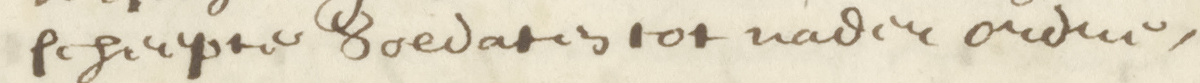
scheepte Soldaten tot nader ordre.
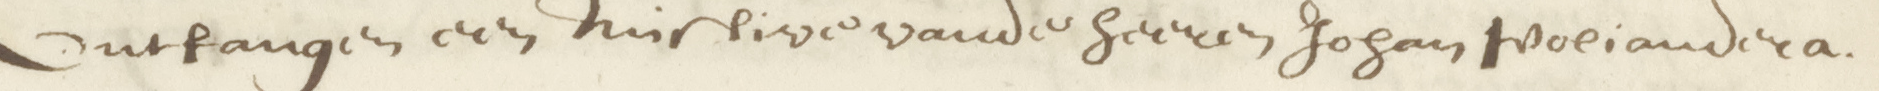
Ontfangen een missive vande heeren Johan Poliandera.
